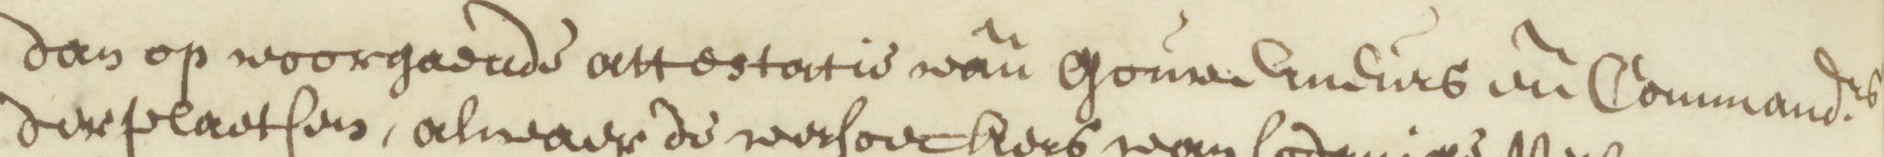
dan op voorgaende attestatie van Gouverneurs en Commandrs.
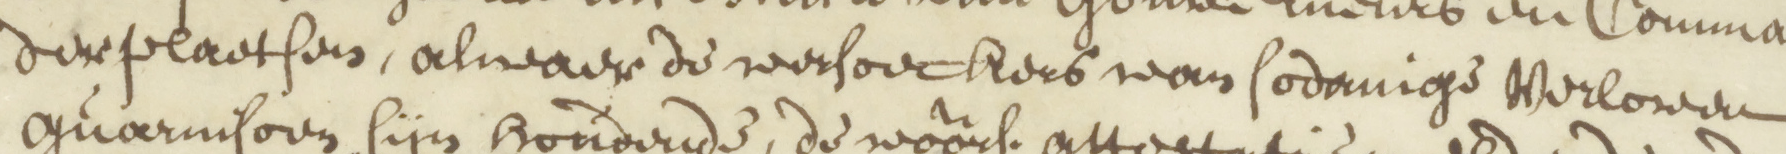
der plaetsen, alwaer de versoeckers van sodanige Verloven
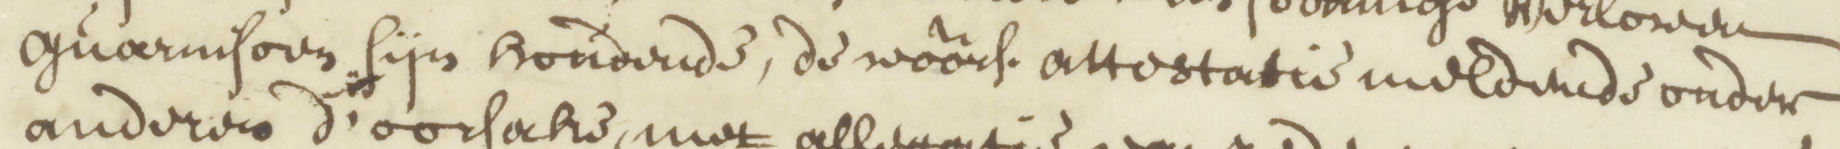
Guarnisoen sijn houdende, de voors. attestatie meldende onder
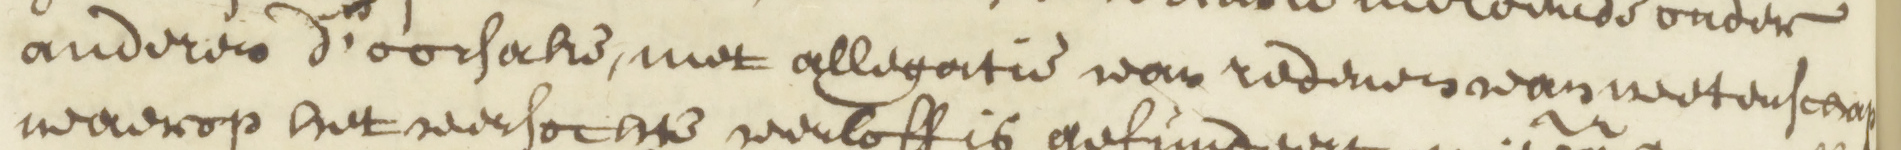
anderen d'oorsake, met allegatie van redenen van wetenschap
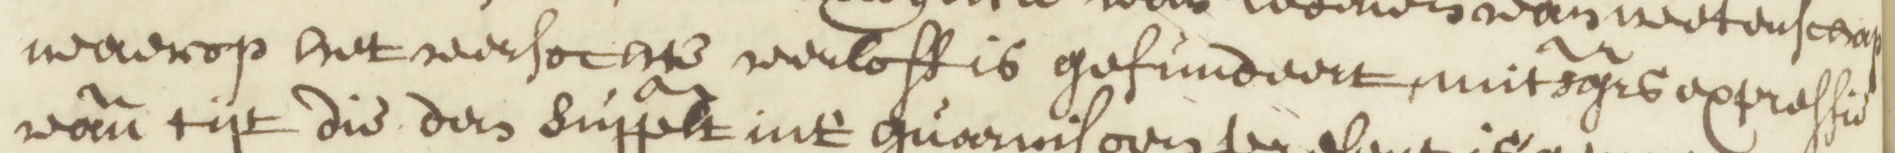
waerop het versochte verloff is gefundeert, mitsgrs expressie
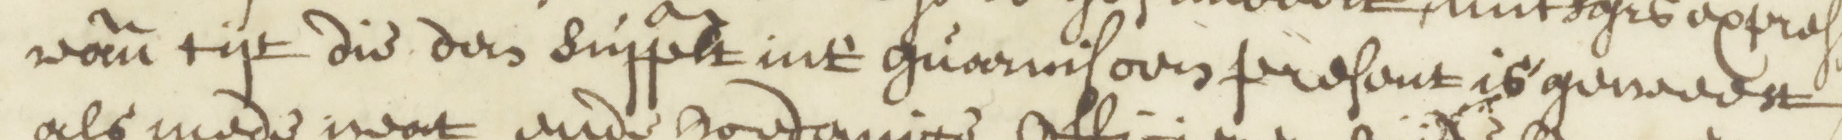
van tijt die den Supplt int' Guarnisoen present is geweest
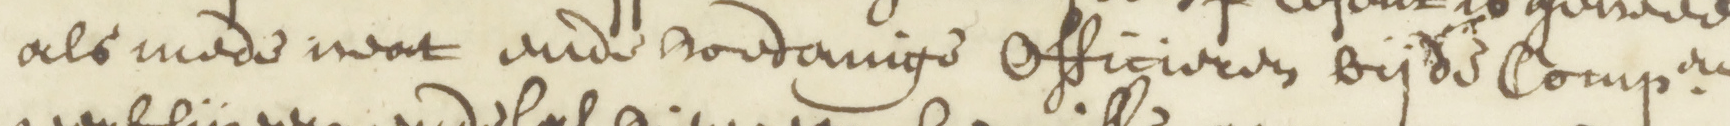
als mede wat ende hoedanige Officieren bij de Compen.
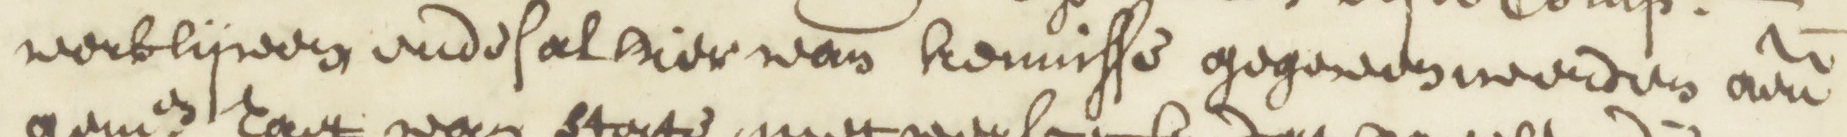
verblijven ende sal hier van kennisse gegeven werden aen
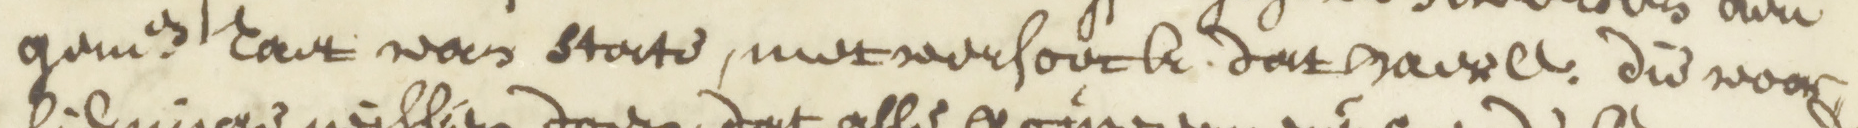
gemen. Raet van State, met versoeck dat haer E. die voor„
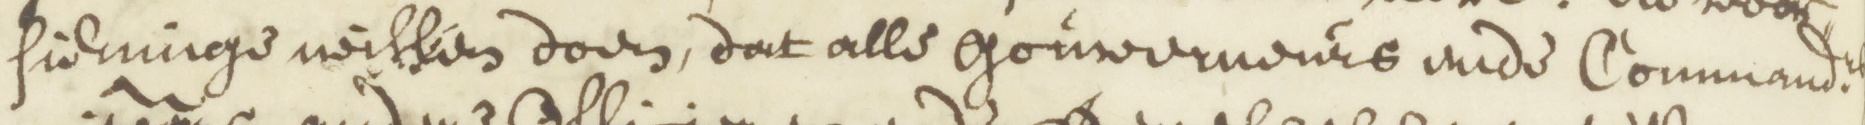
sieninge willen doen, dat alle Gouverneurs ende Commandrs.
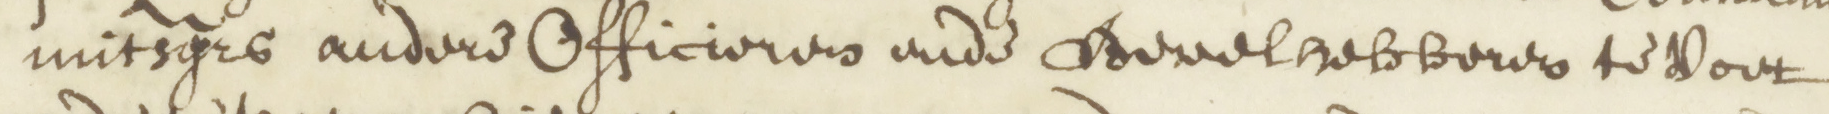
mitsgrs andere Officieren ende Bevelhebberen te Voet
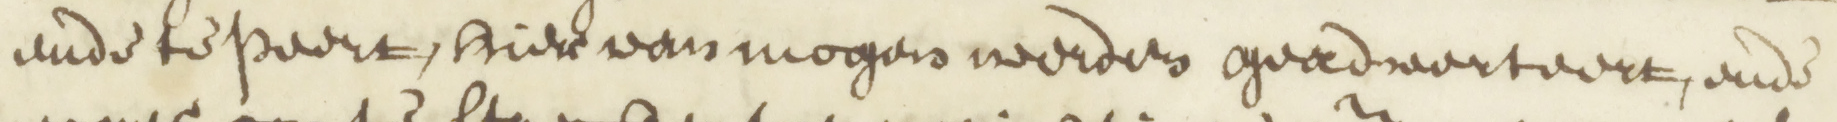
ende te Peert, hier van mogen werden geadverteert, ende
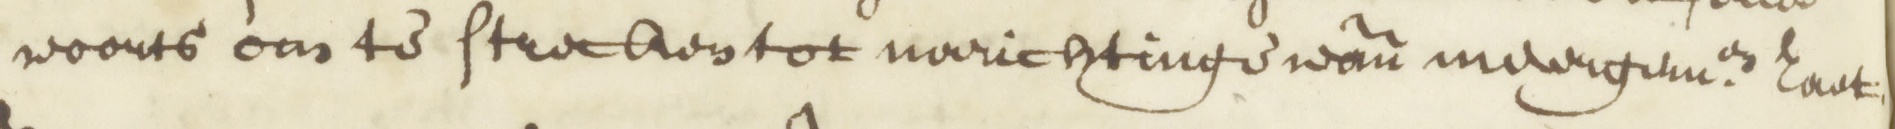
voorts om te strecken tot narichtinge van meergemen. Raet.
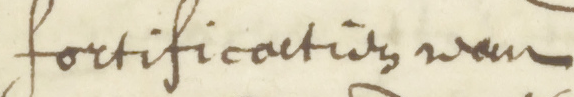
fortificatien van
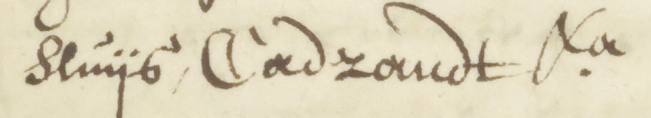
Sluijs, Cadzandt @
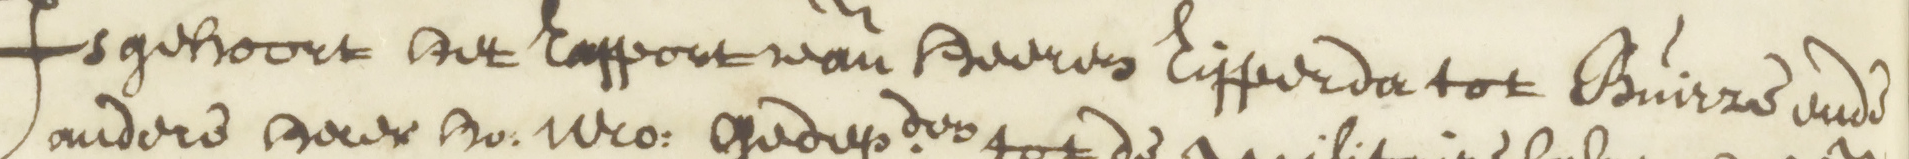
Is gehoort het Rapport van Heeren Ripperda tot Buirze ende
